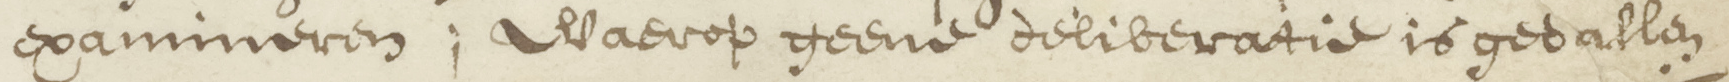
examineren: Waerop geene deliberatie is gevallen.
